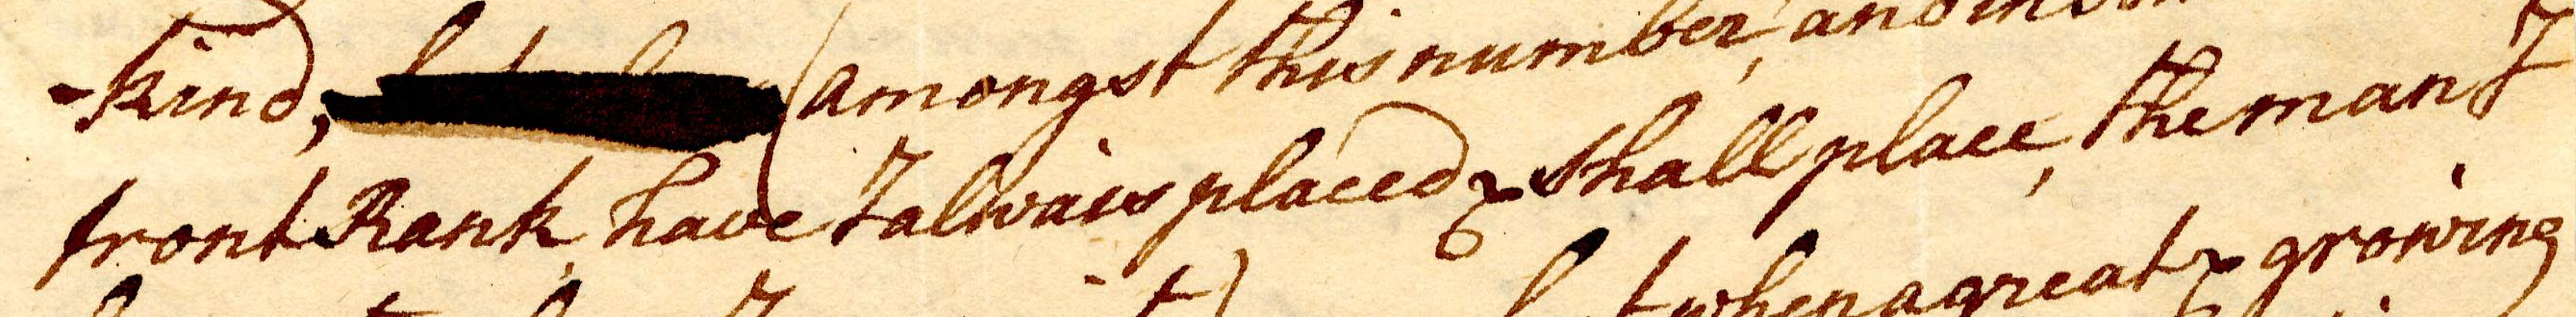front Rank have I alwais placed & shall place The man I
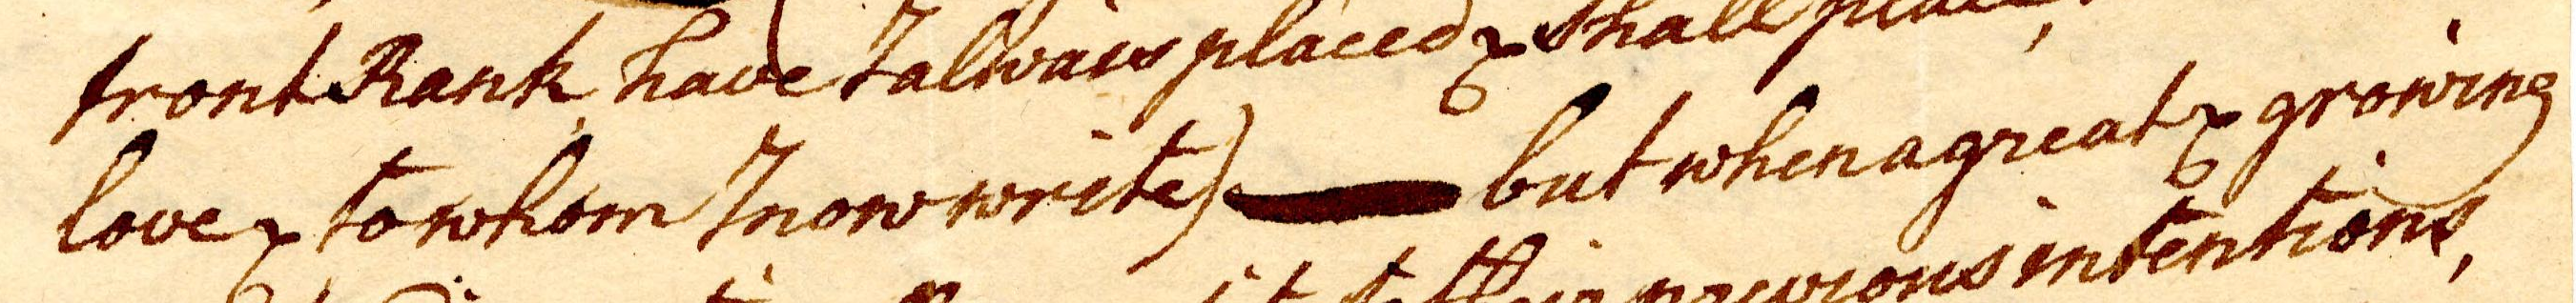love & to whom I now write)- but when a great & growing
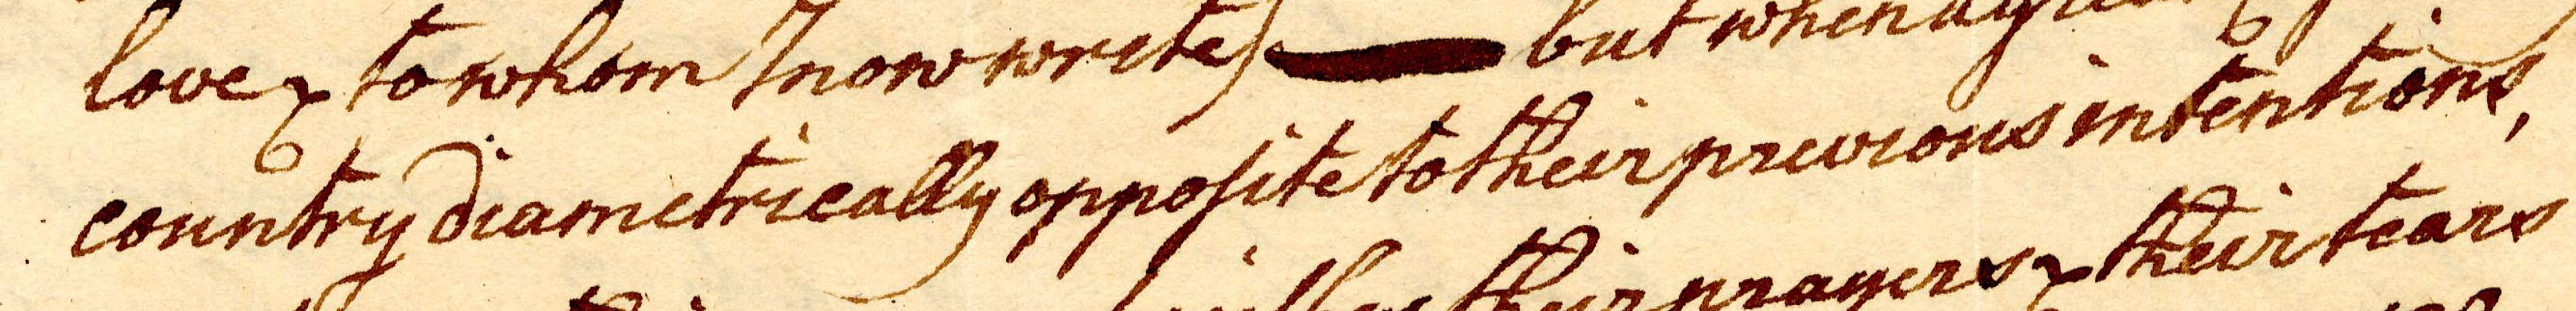country diametrically opposite to their previous intentions,
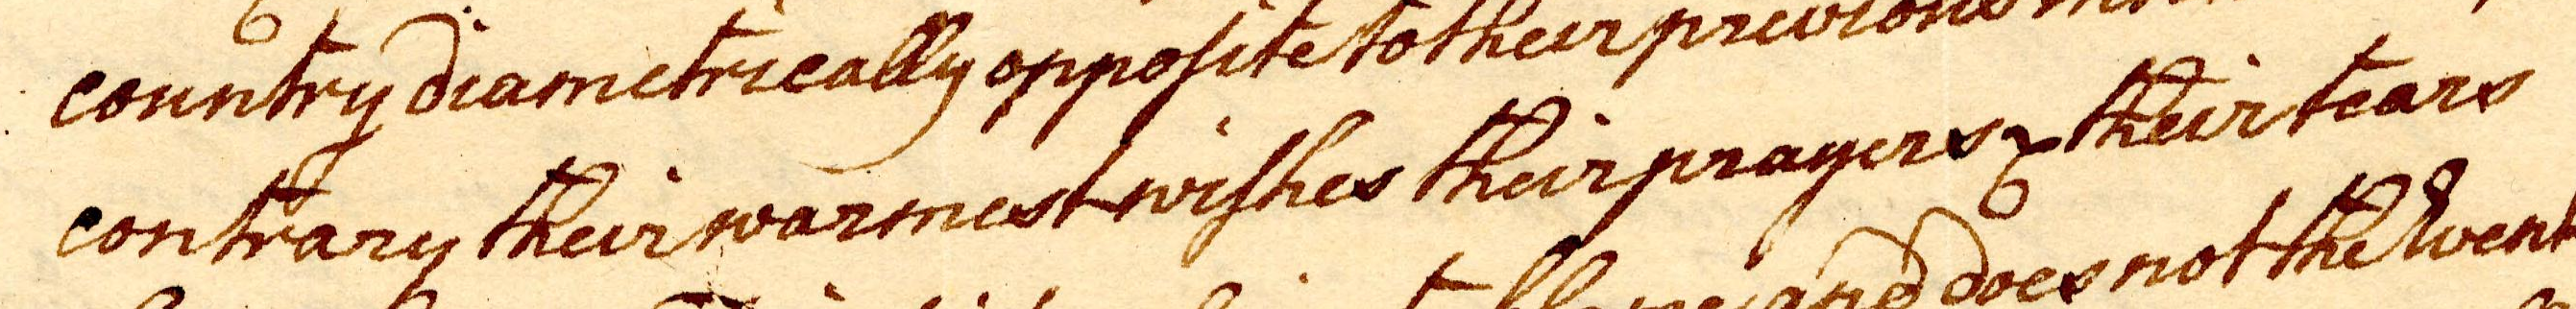contrary their warmest wishes their prayers & their tears
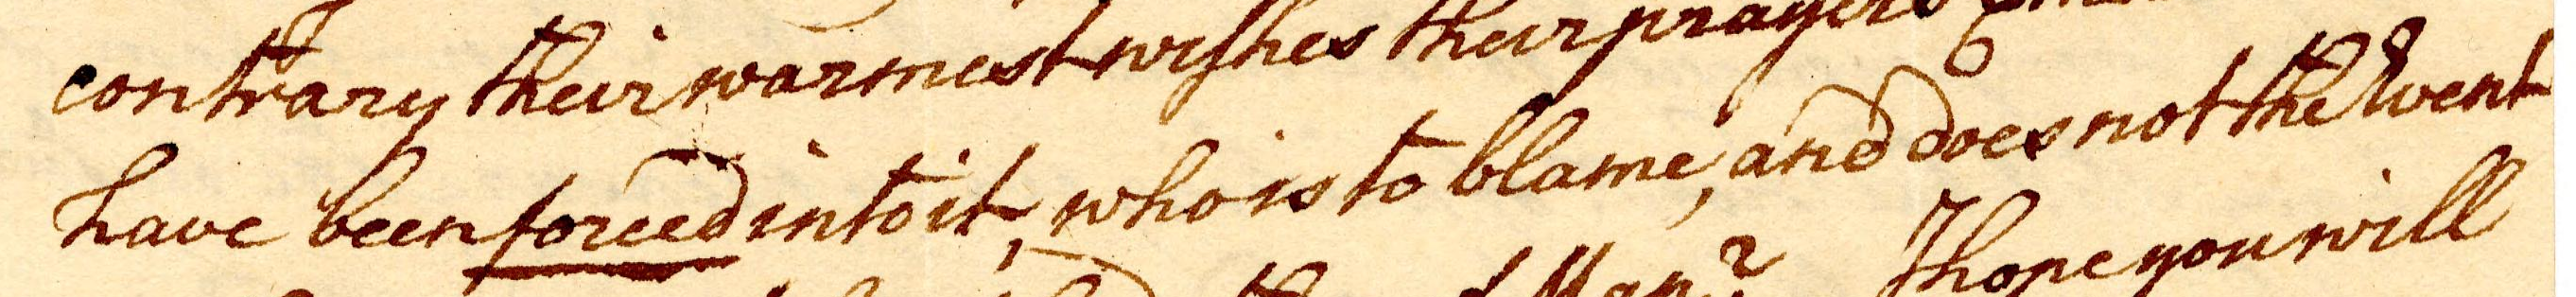have been forced into it who is to blame, and does not the Event
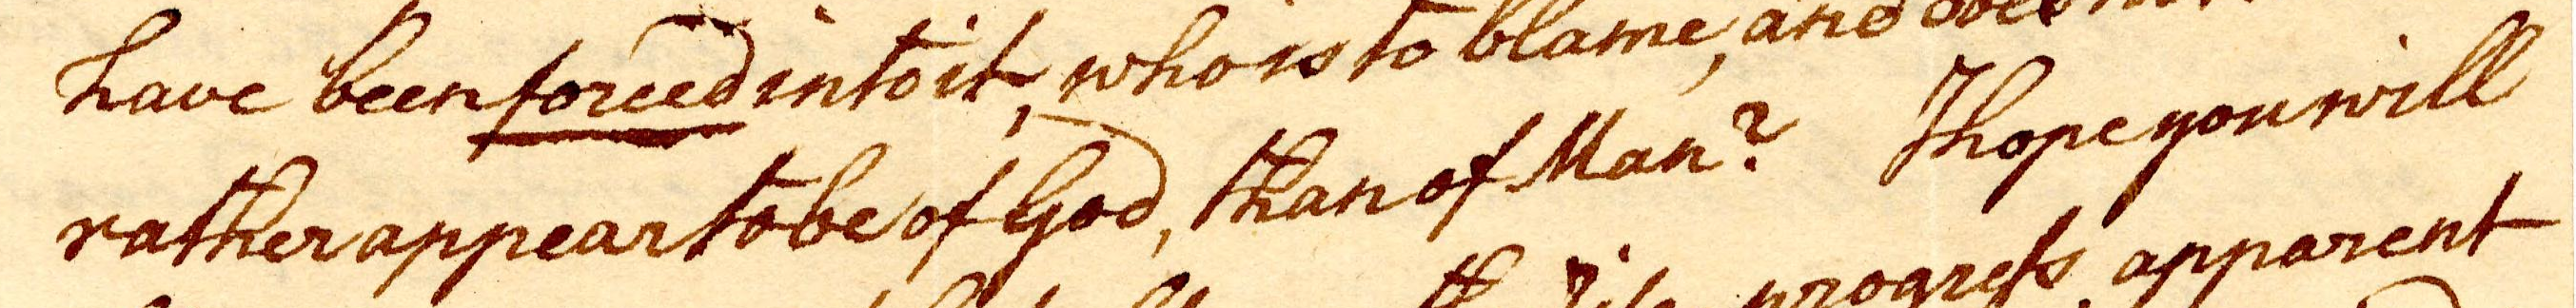rather appear to be of God, than of Man? I hope you will
